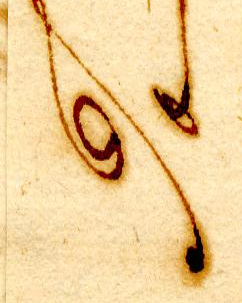To
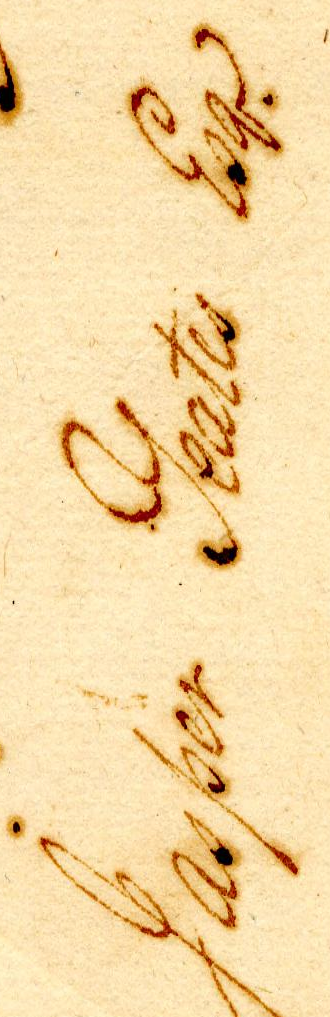Jasper Yeates Esq.
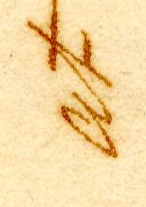at
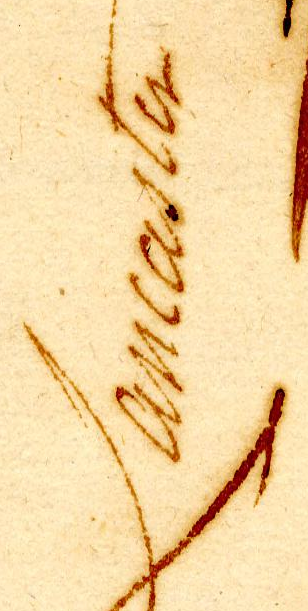Lancaster
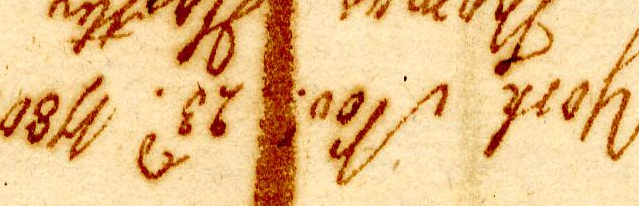York Nov^r. 23^d. 1780.
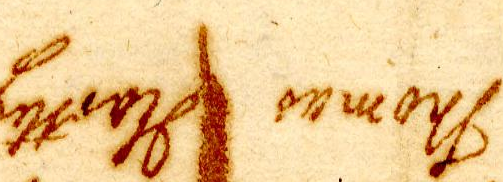Thomas Hartley
